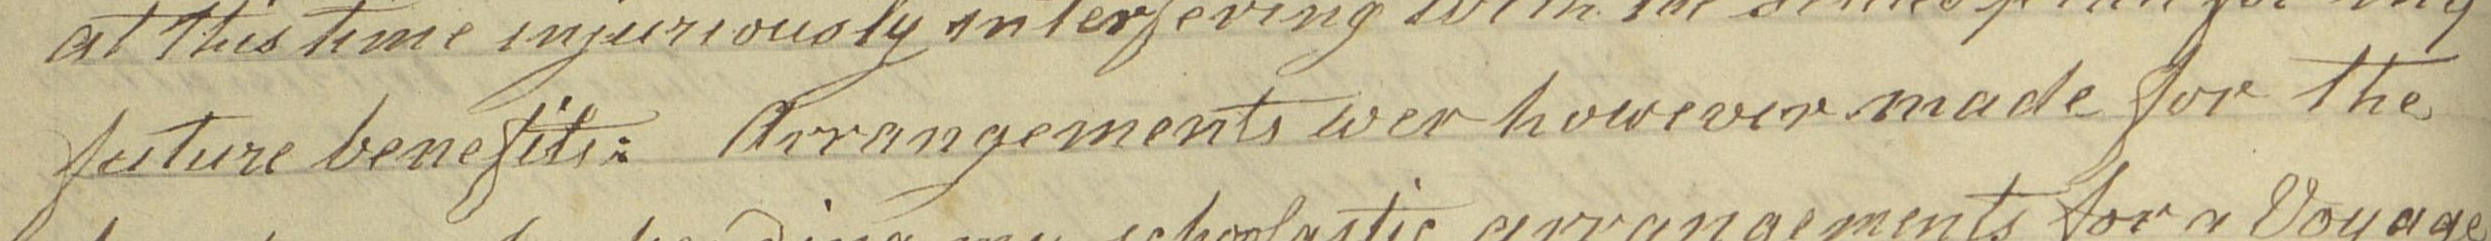future benefits: Arrangements wer however made for the
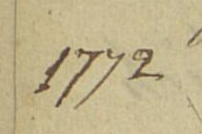1772
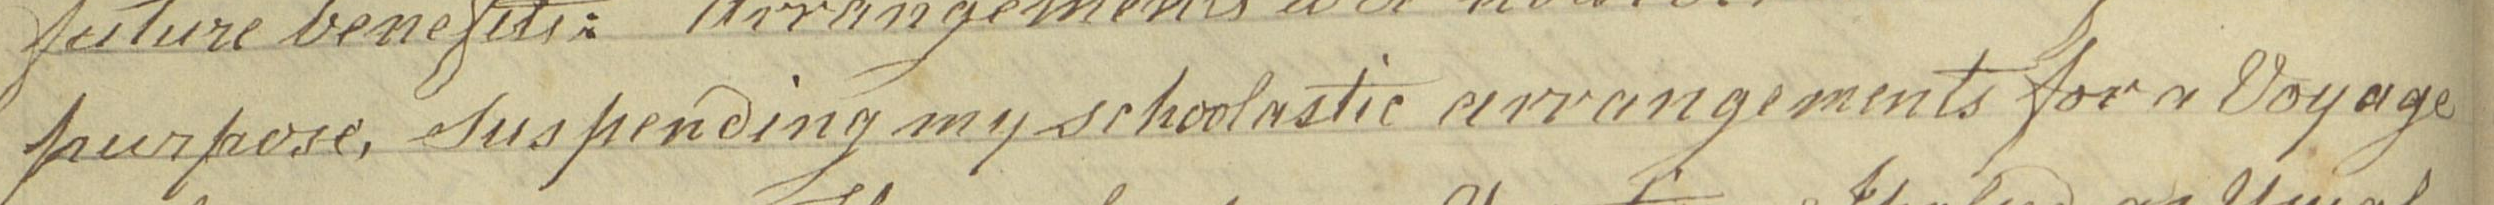purpose, suspending my schoolastic arrangements for a Voyage
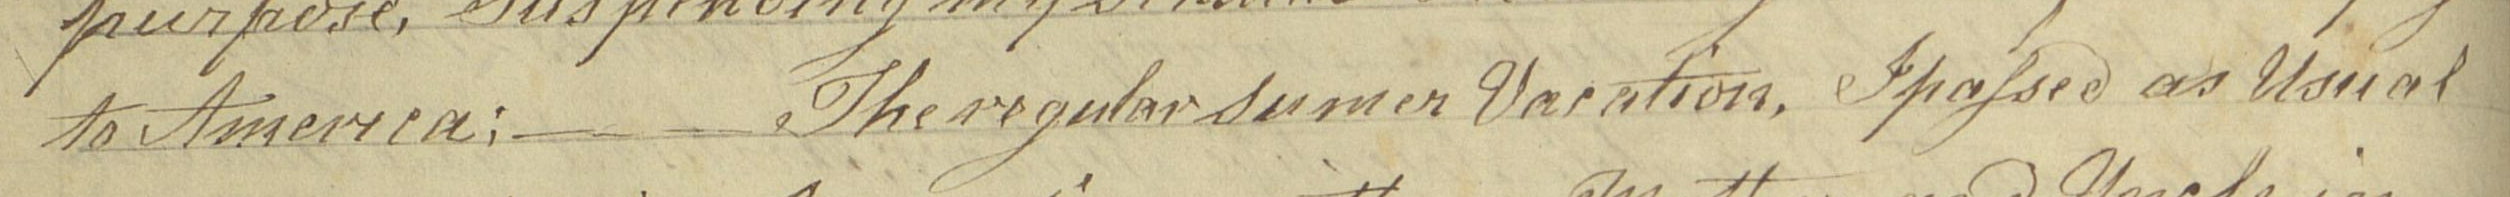to America: The regular sumer Vacation, I passed as Usual
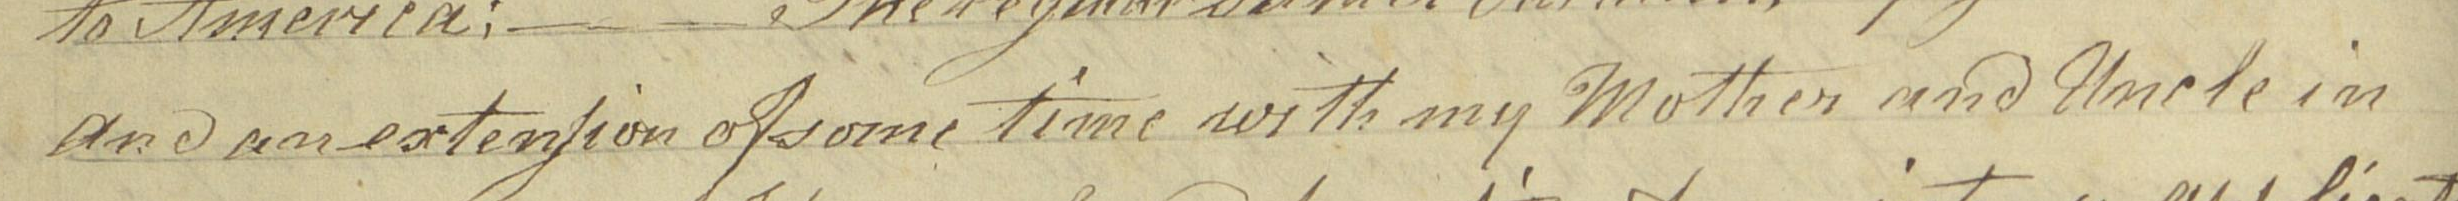and an extension of some time with my Mother and Uncle in
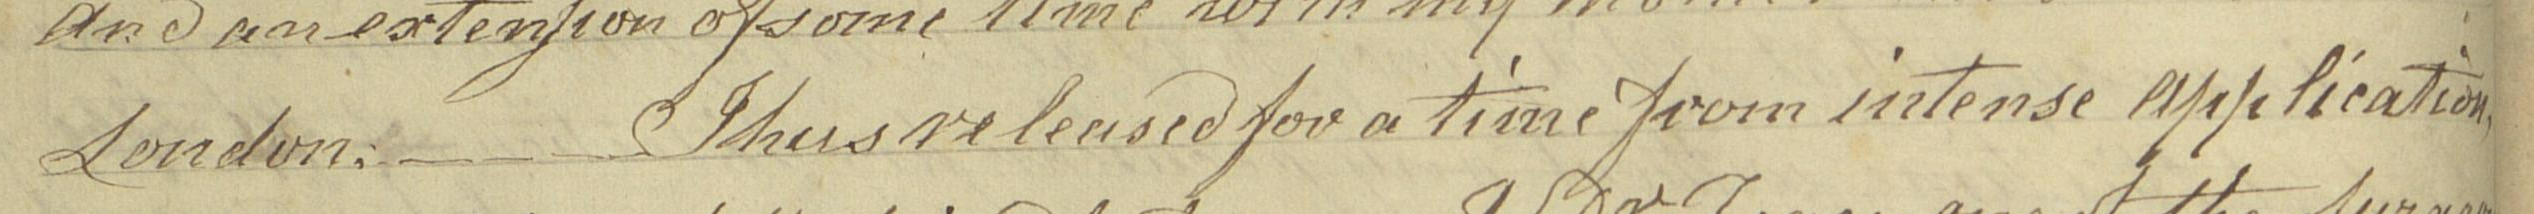London. Thus released for a time from intense Application
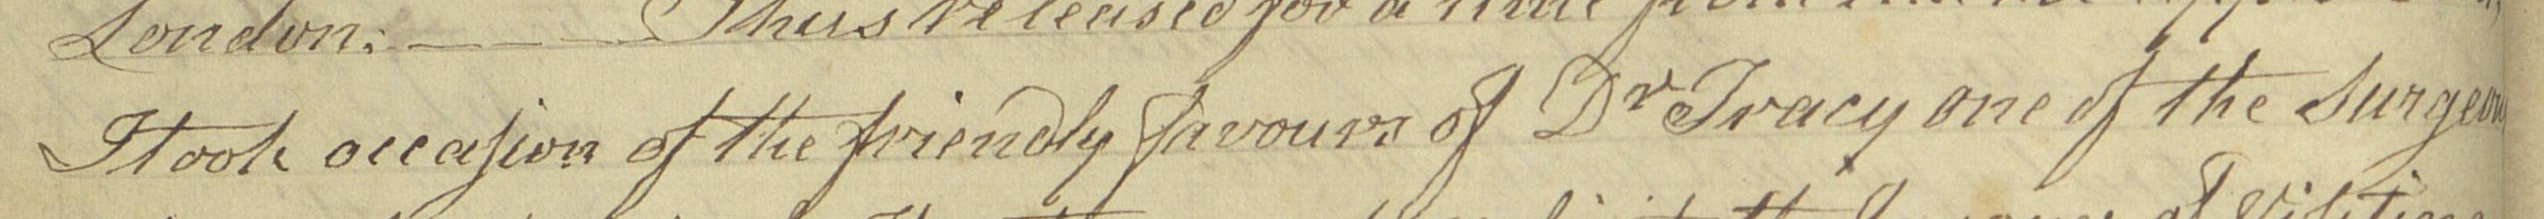I took occasion of the friendly favours of D^r Tracy one of the Surgeon
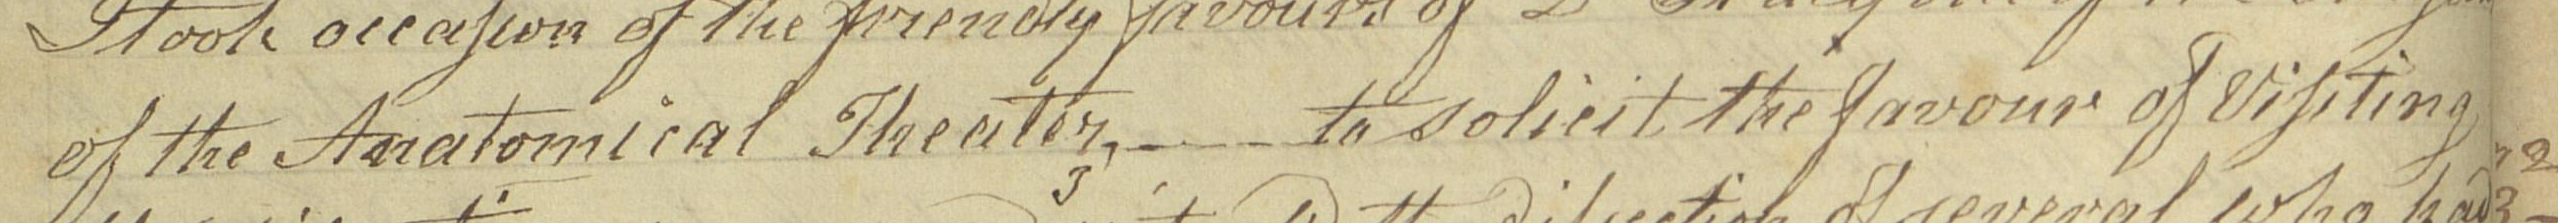of the Anatomical Theater, to solicit the favour of Visiting
